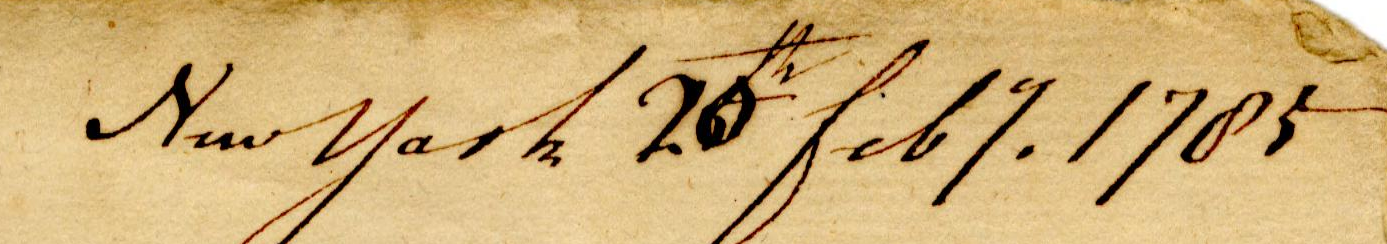New York 20^th feb^y. 1785
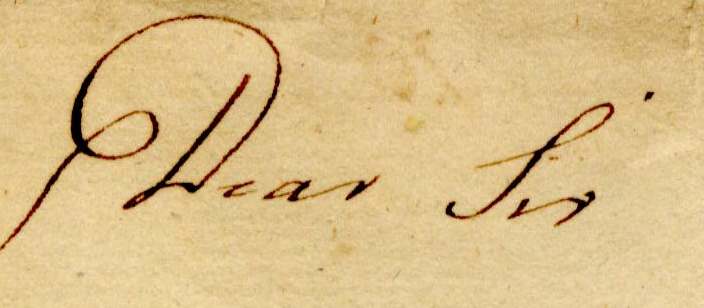Dear Sir
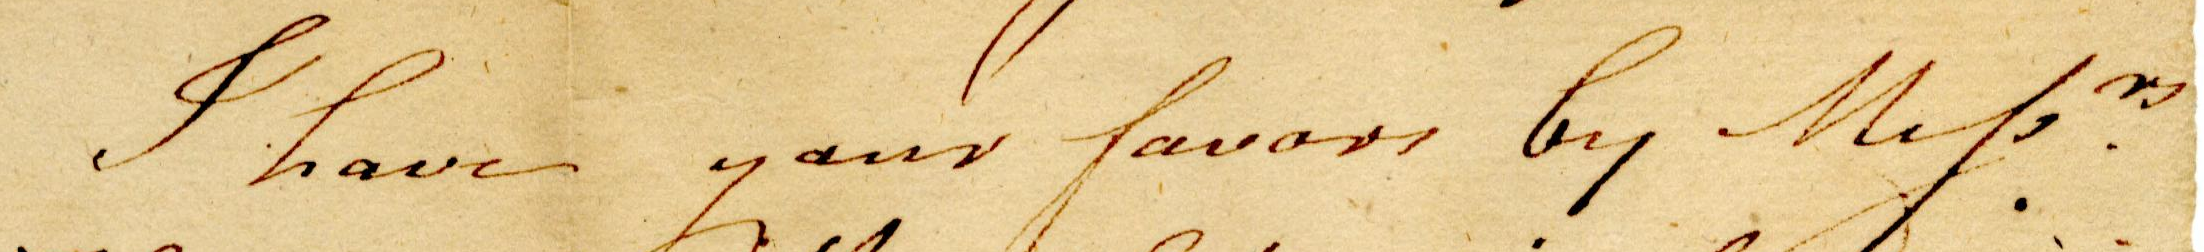I have your favors by Mess^rs.
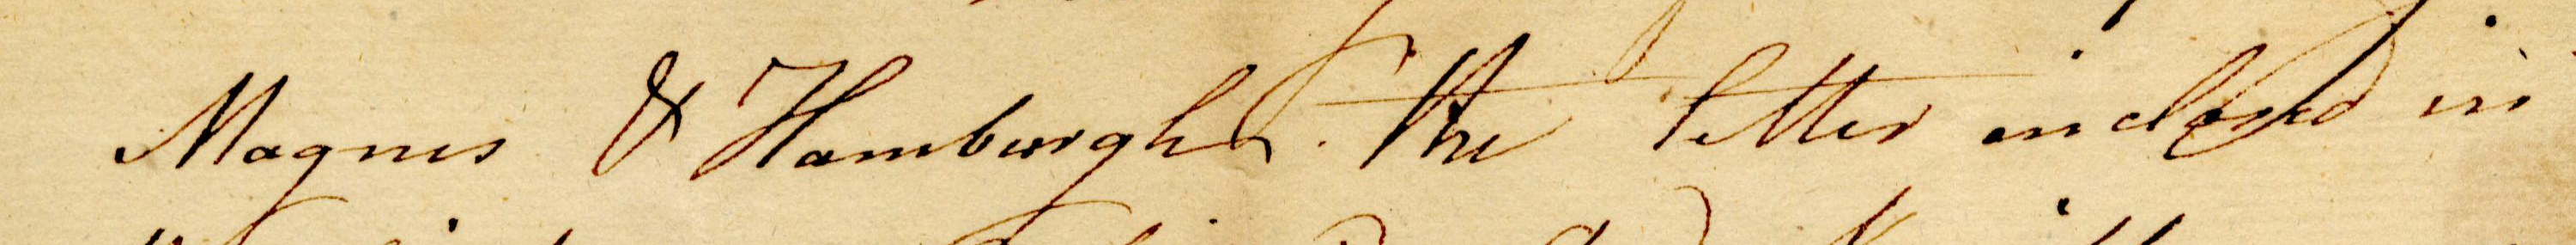Magnes & Hamburgh the letter in closed in
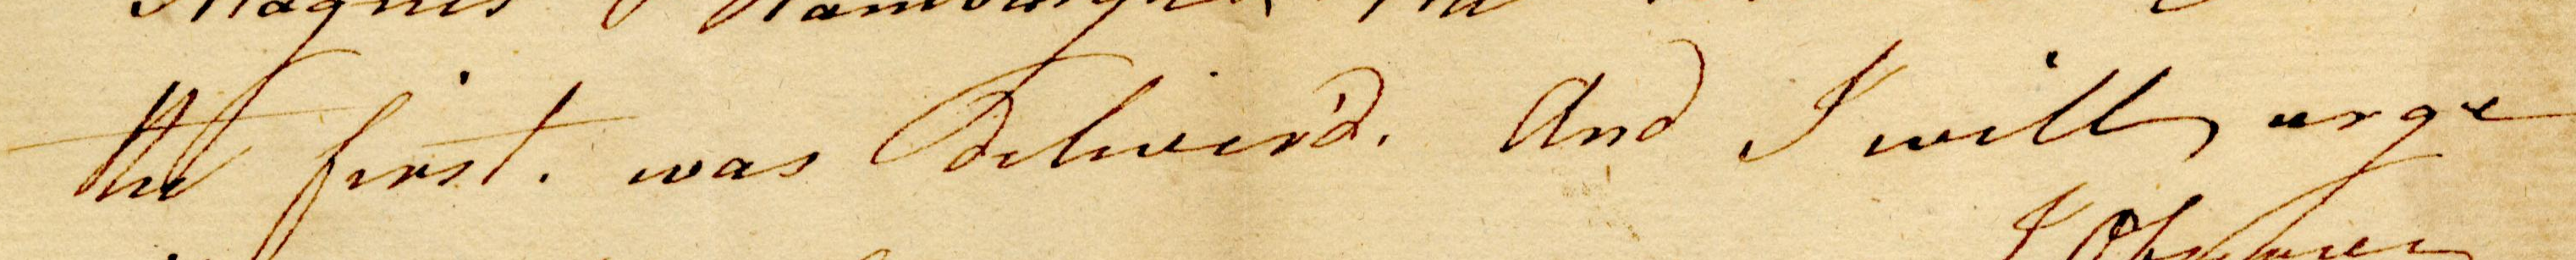the first. was deliver'd. And I will urge
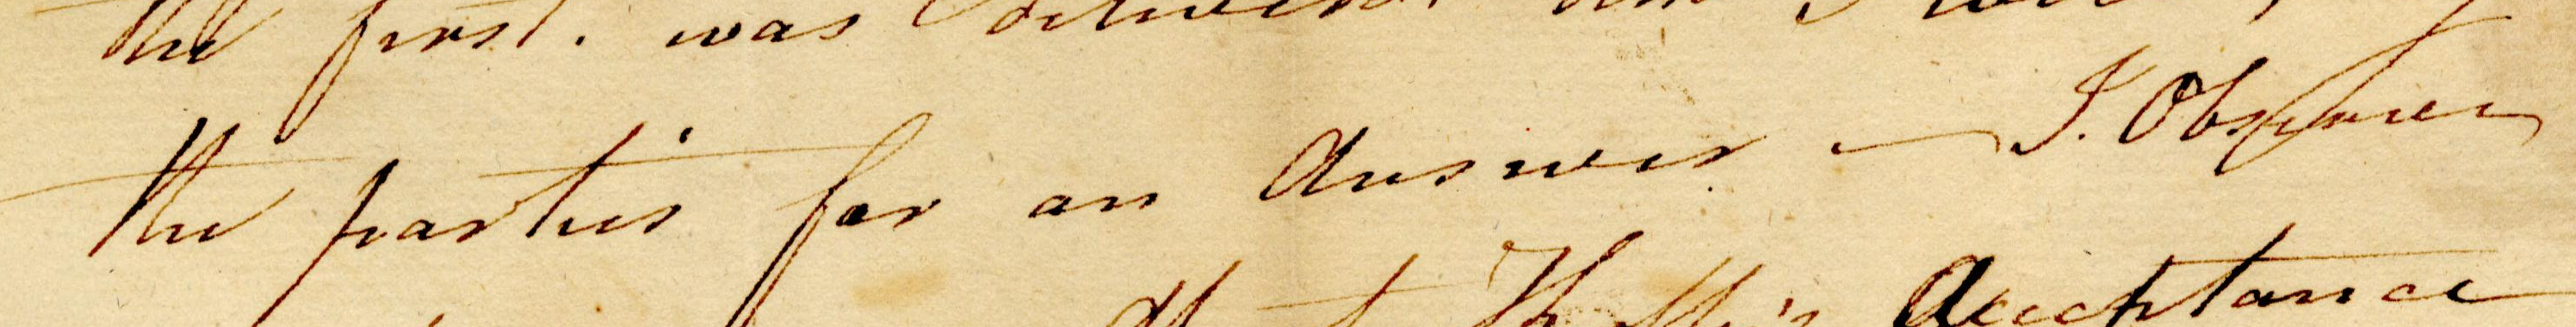the parties for an Answer.- I observe
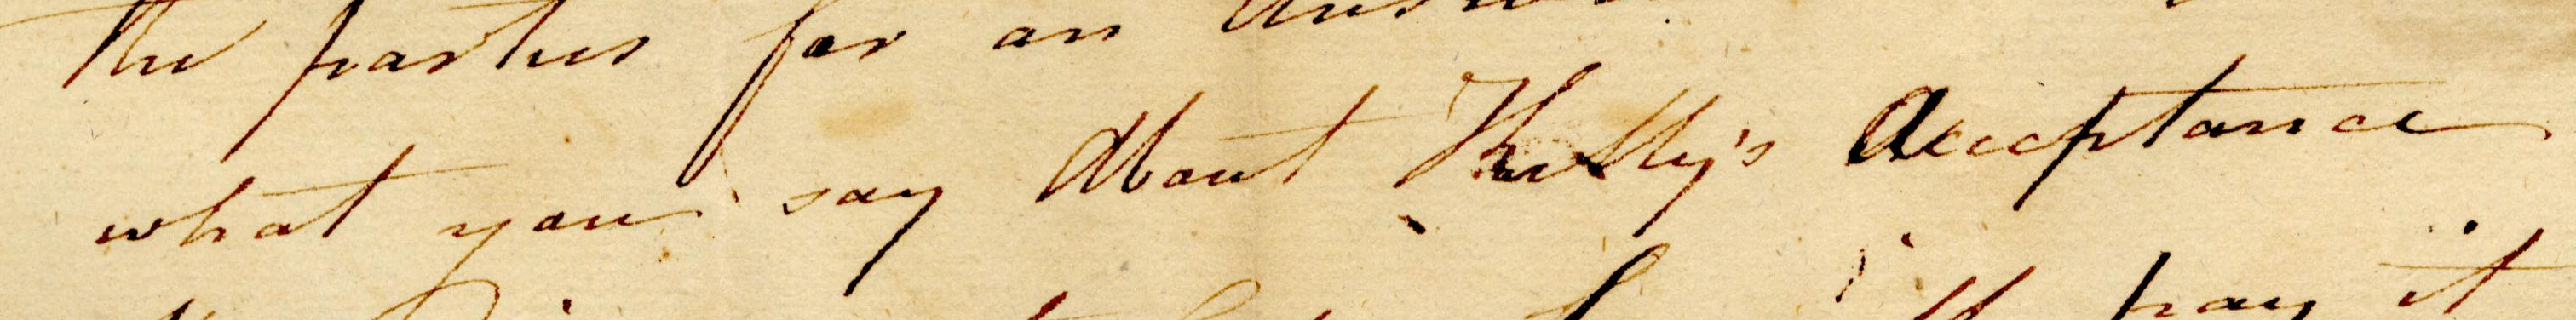what you say about Kelly's Acceptance
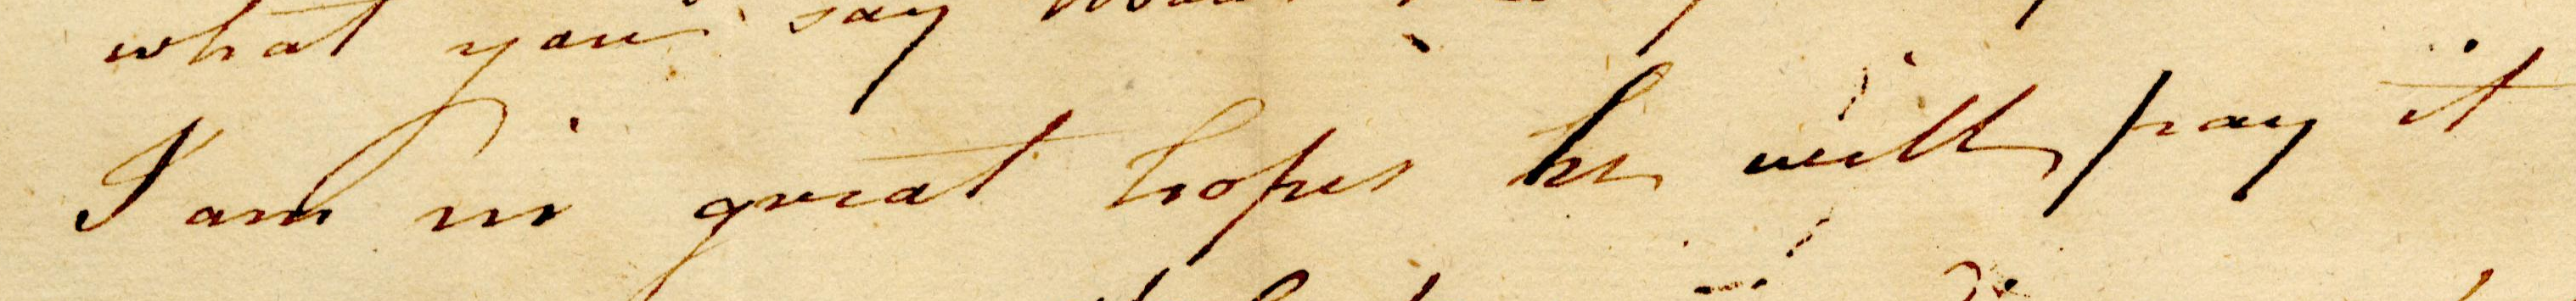I am in great hopes he will pay it
